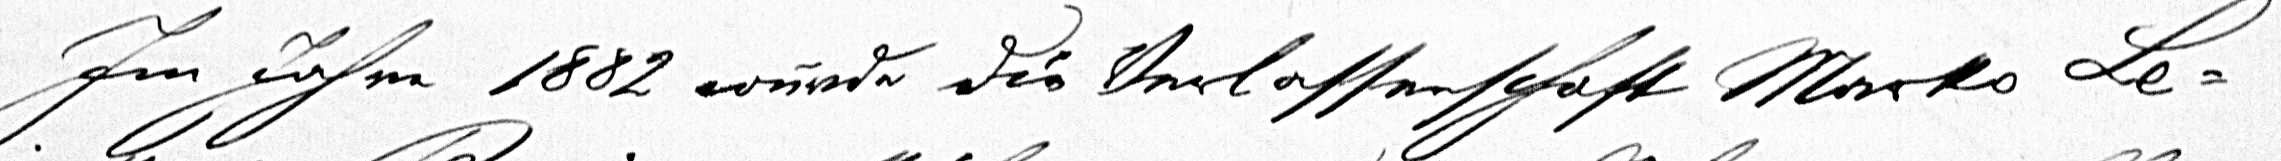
Im Jahre 1882 wurde die Verlassenschaft Marko Le¬
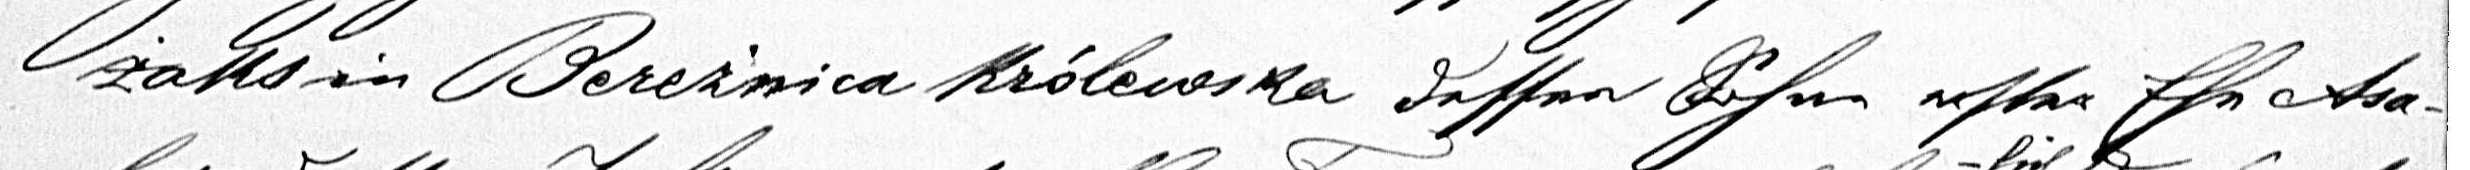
żaks in Bereżnica Królewska dessen Sohn erster Ehe Asa¬
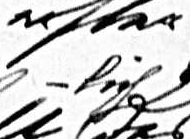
lich
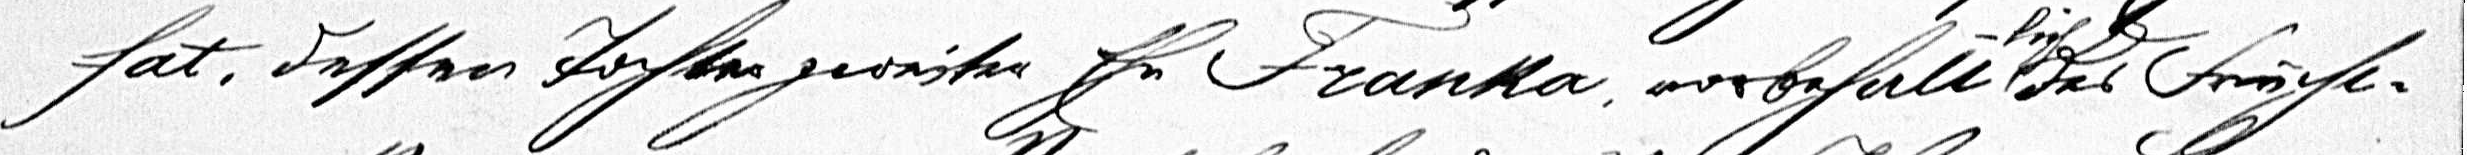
fat, dessen Tochter zweite Ehe Franka, vorbehalt des Frucht
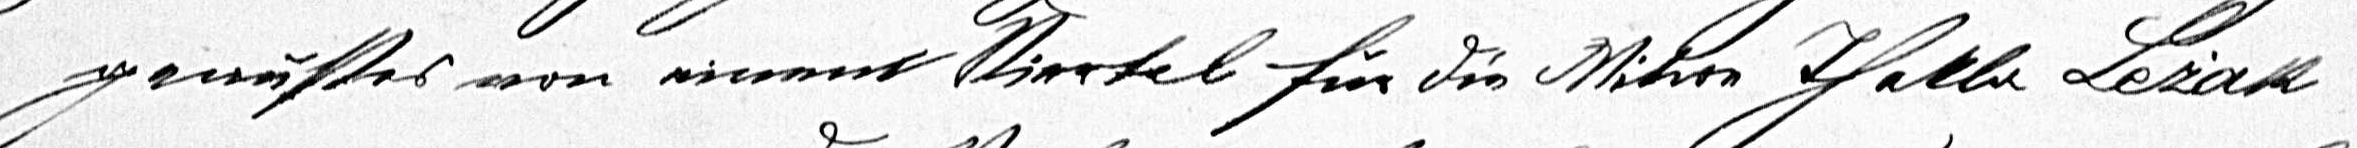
genußes von einem Viertel für die Witwe Thekla Leżak
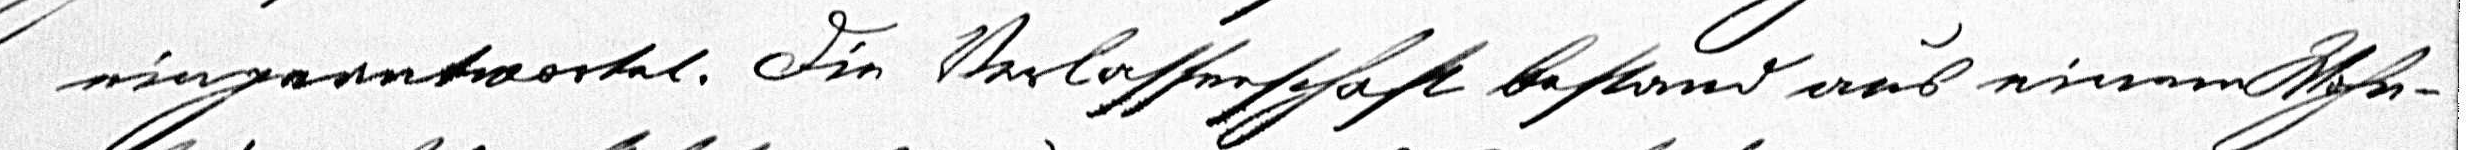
eingeantwortet Die Verlassenschaft bestand aus einem Wohn¬
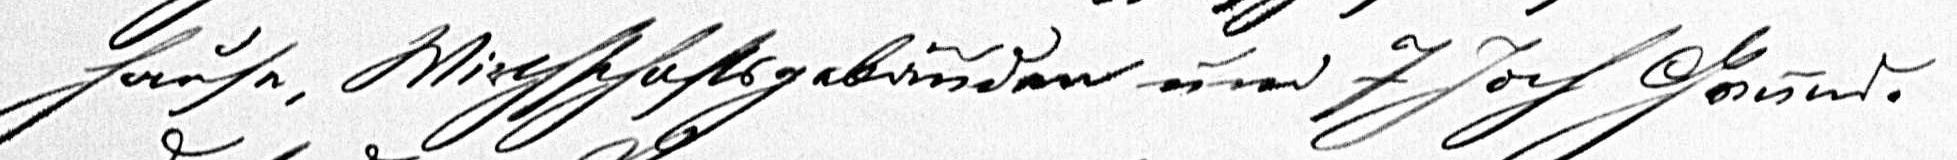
hause, Wirtschaftsgebäuden und 7 Joch Grund.
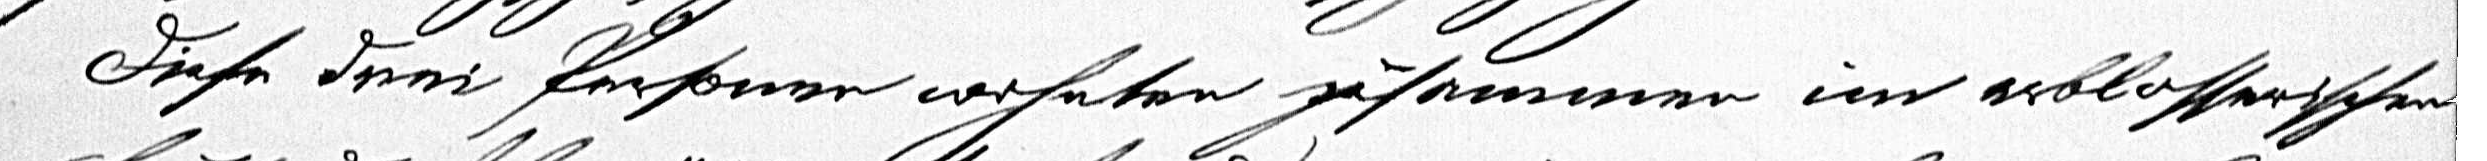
Diese drei Personen wohnten zusammen im erblasserischen
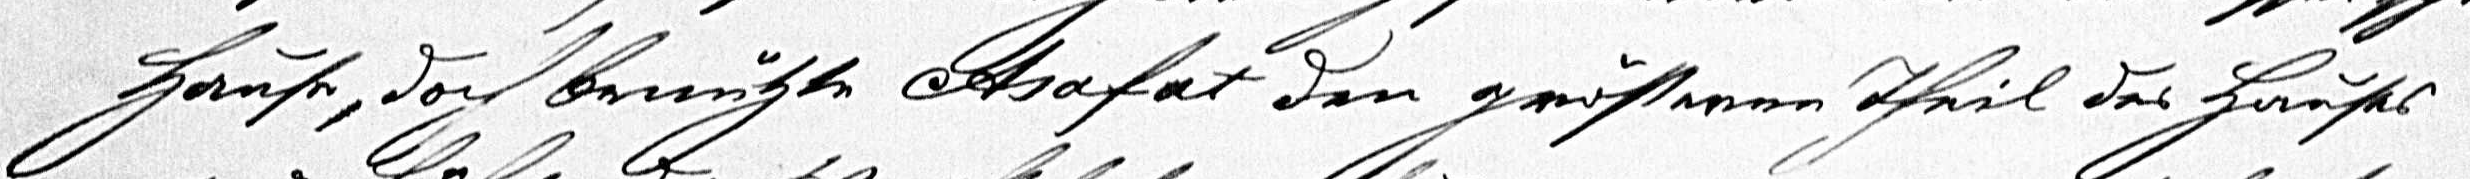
Hause, doch benützte Asafat den größeren Theil des Hauses
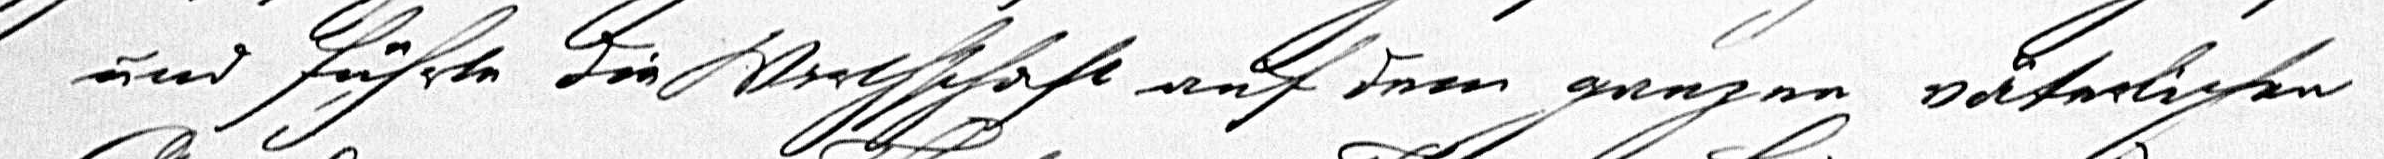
und führte die Wirtschaft auf dem ganzen väterlichen
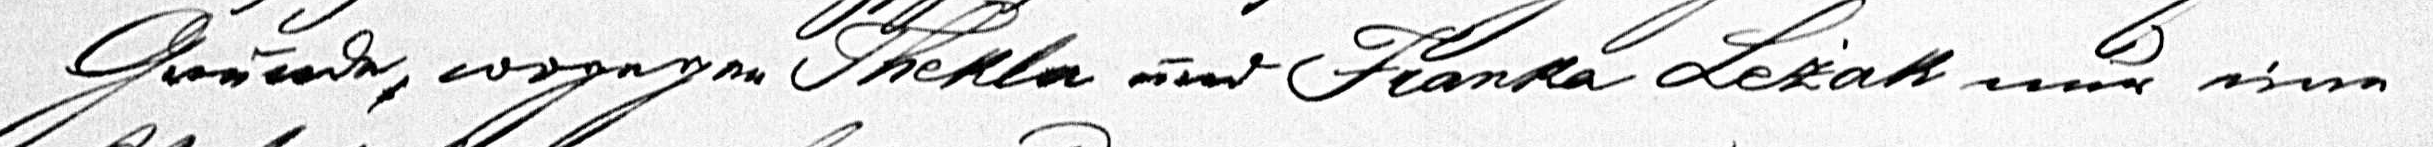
Grunde, wogegen Thekla und Franka Leżak nur eine
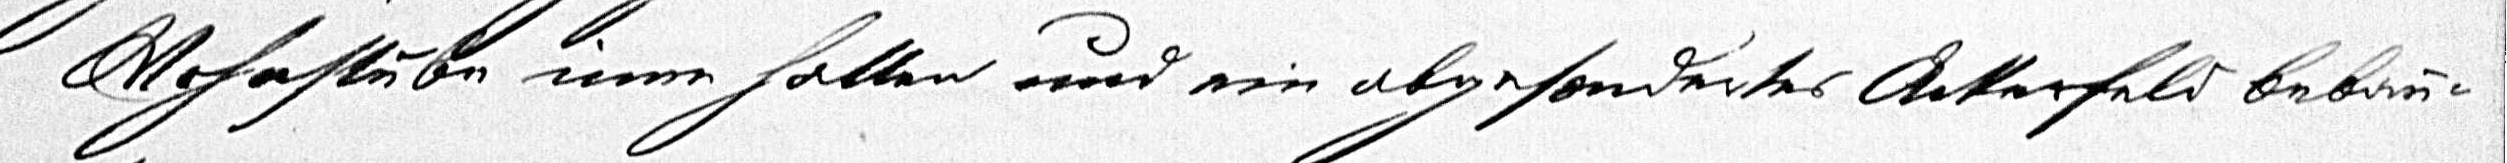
Wohnstube inne hatten und ein abgesondertes Ackerfeld bebau¬
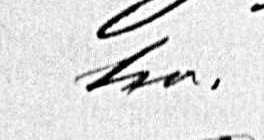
ten.
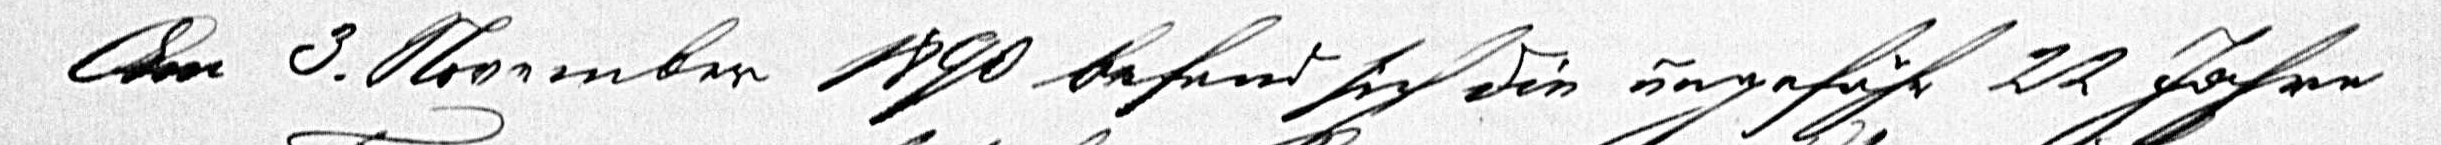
Am 3. November 1890 befand sich die ungefähr 22 Jahre
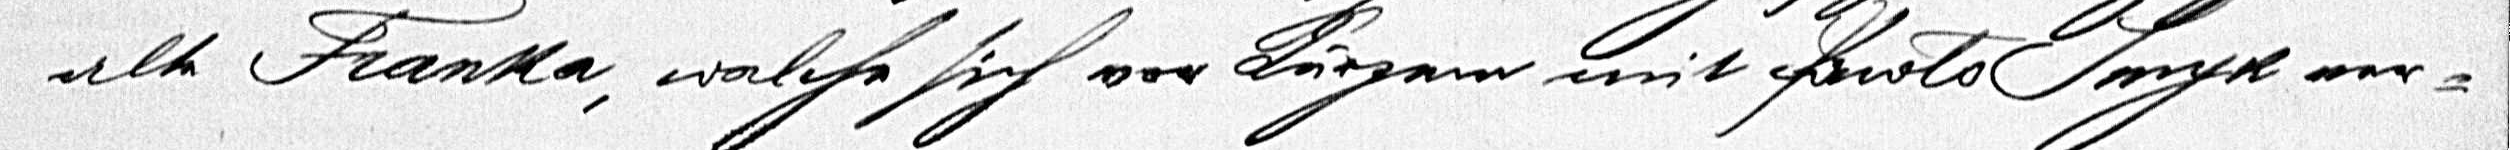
alte Franka, welche sich vor Kürzem mit Pawło Semyk ver¬
